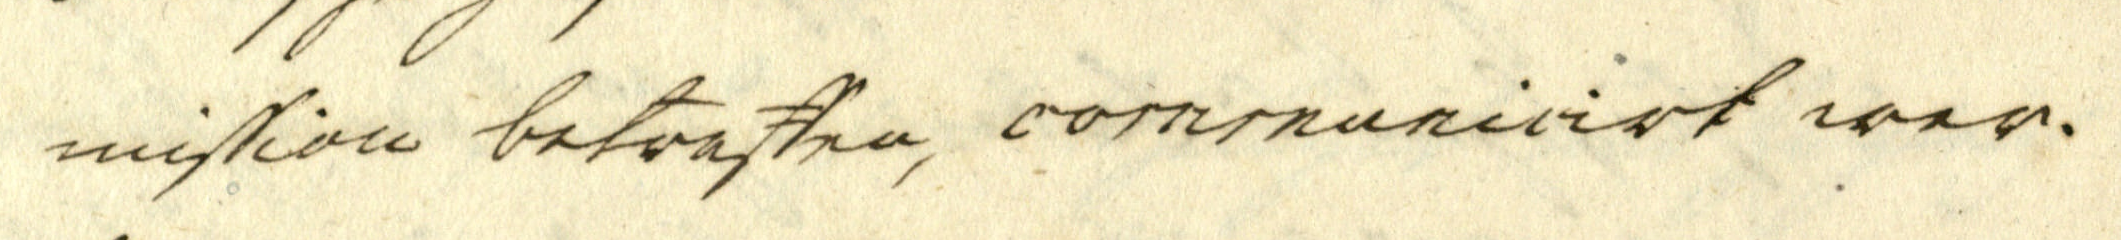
mission betreffen, communicirt wer¬
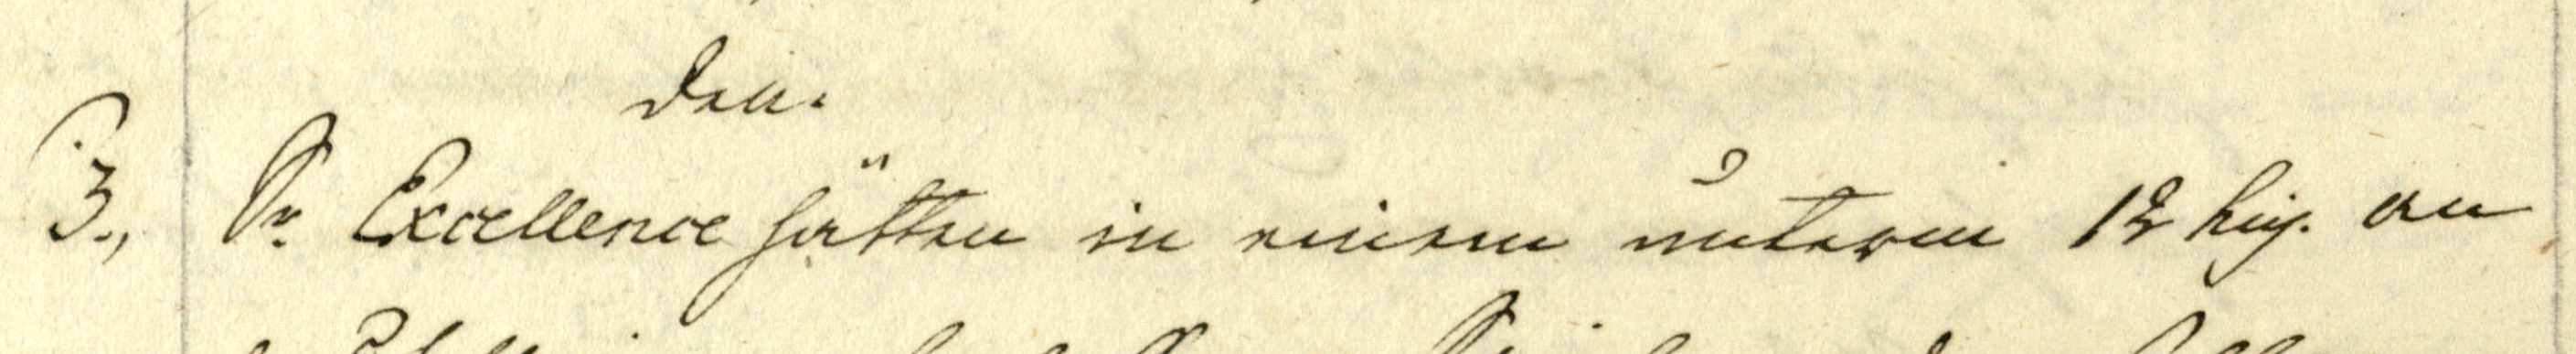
3., Sr Excellence hätten in einem unterm 12 huj. an
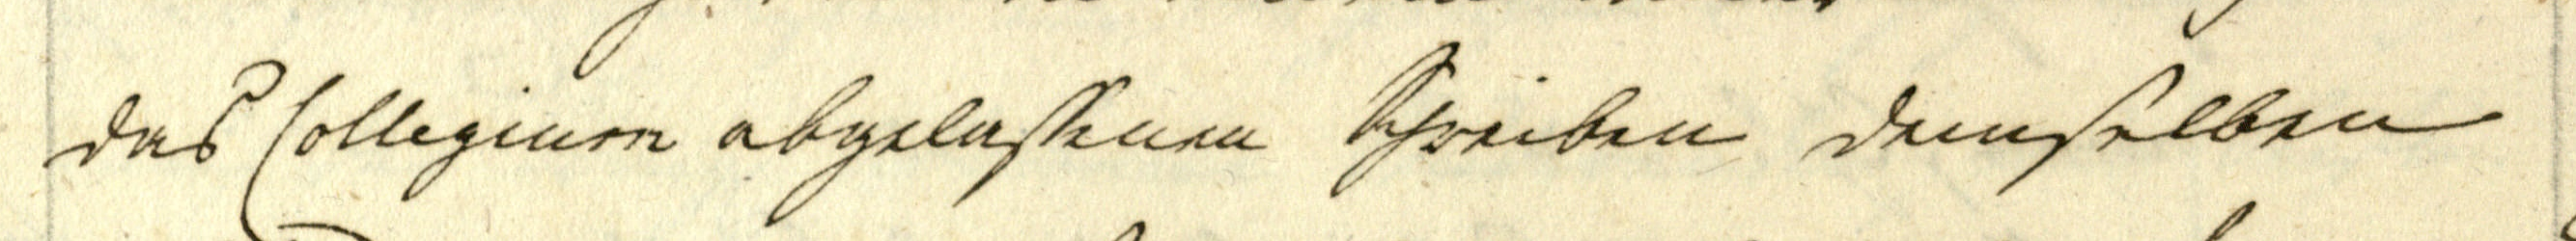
das Collegium abgelassenen Schreiben demselben
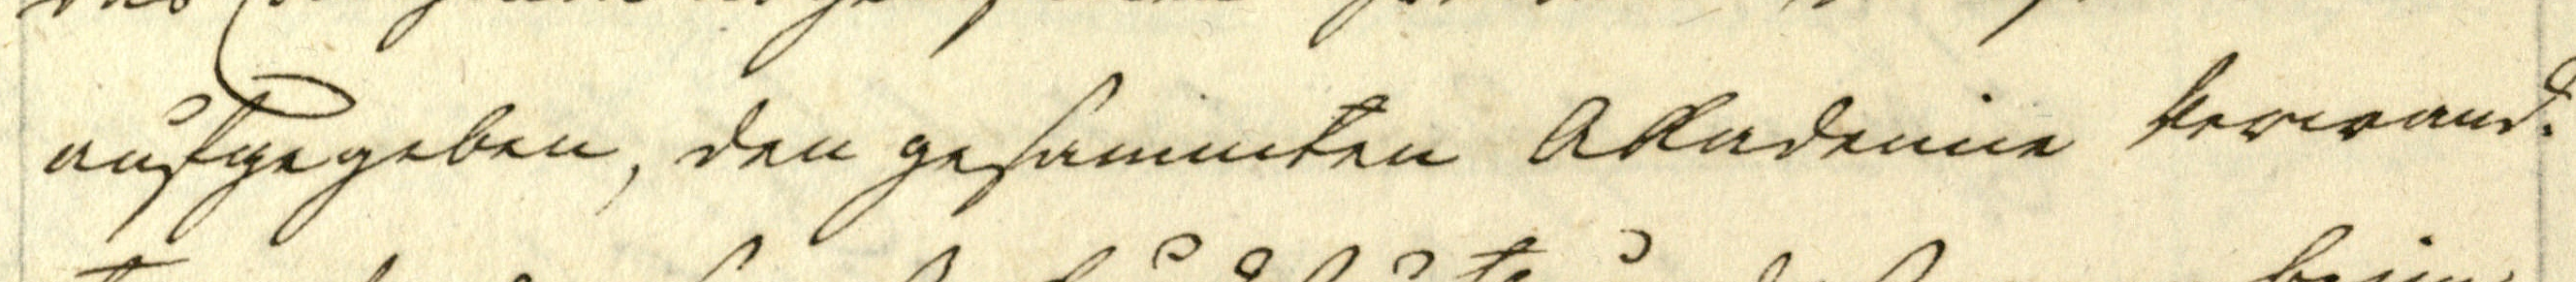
aufgegeben, den gesammten Akademie Verwand¬
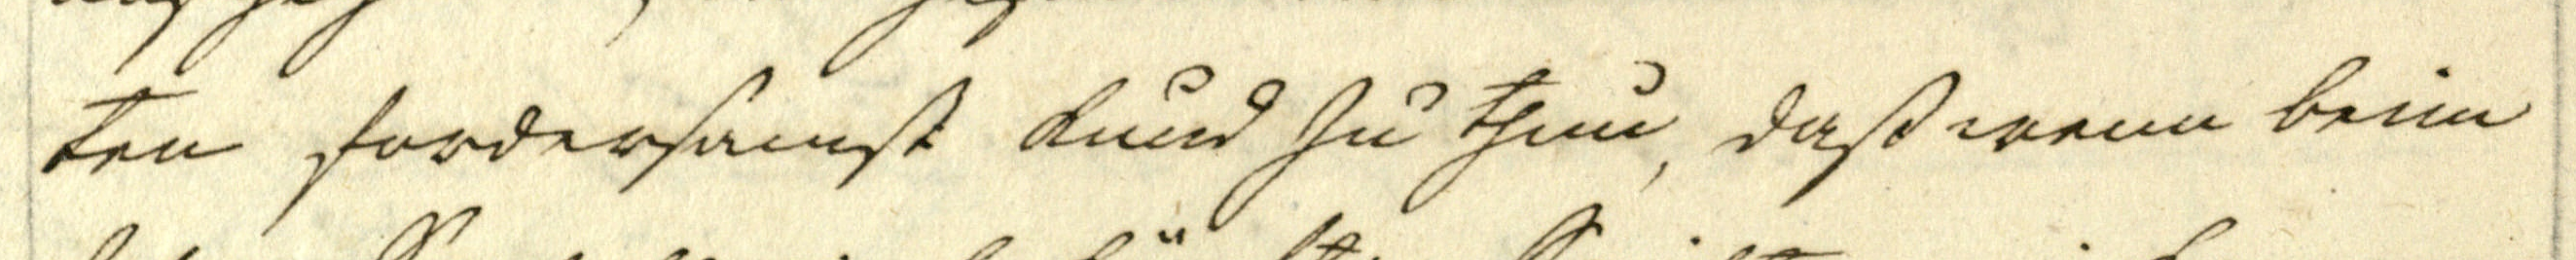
ten fordersamst kund zu thun, daß wenn beim
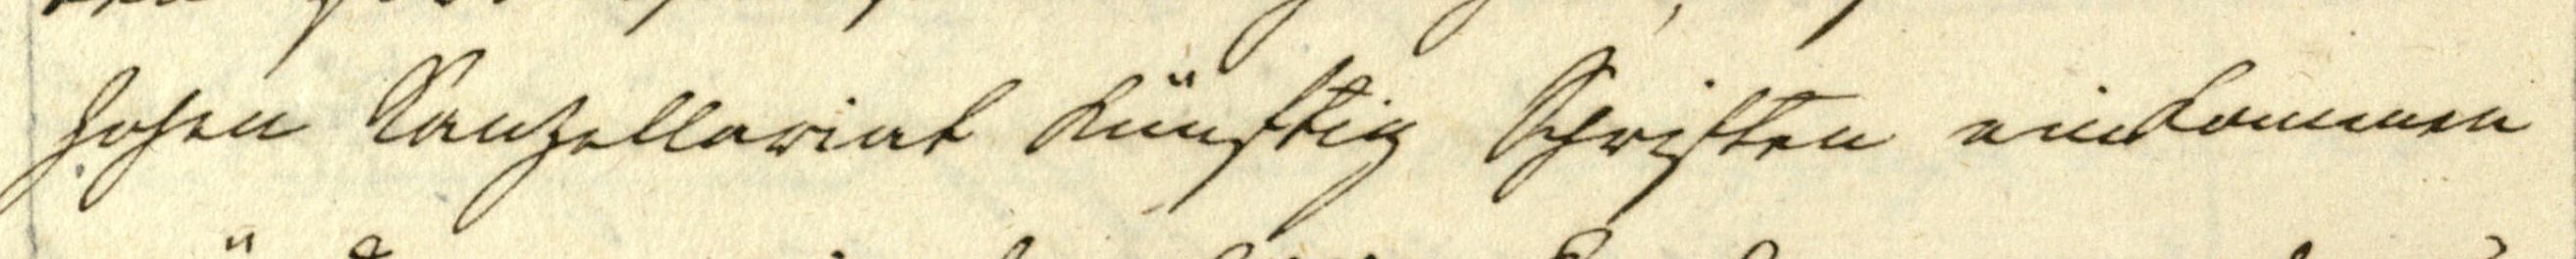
hohen Kanzellariat künftig Schriften einkommen
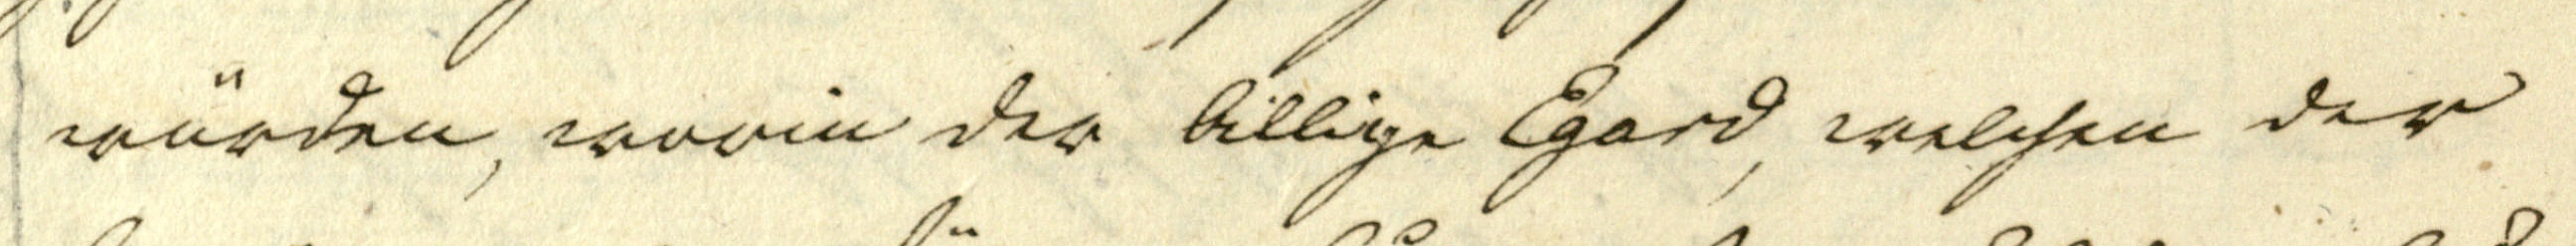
würden, worin der billige Egard welchen der
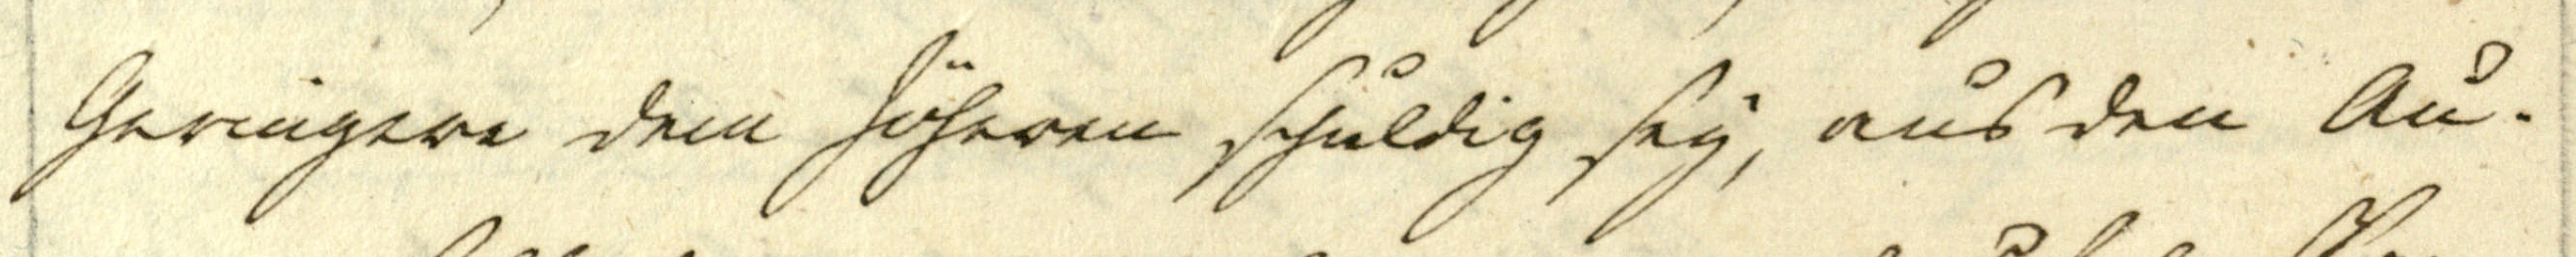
Geringere dem Höheren schuldig seÿ, aus den Au¬
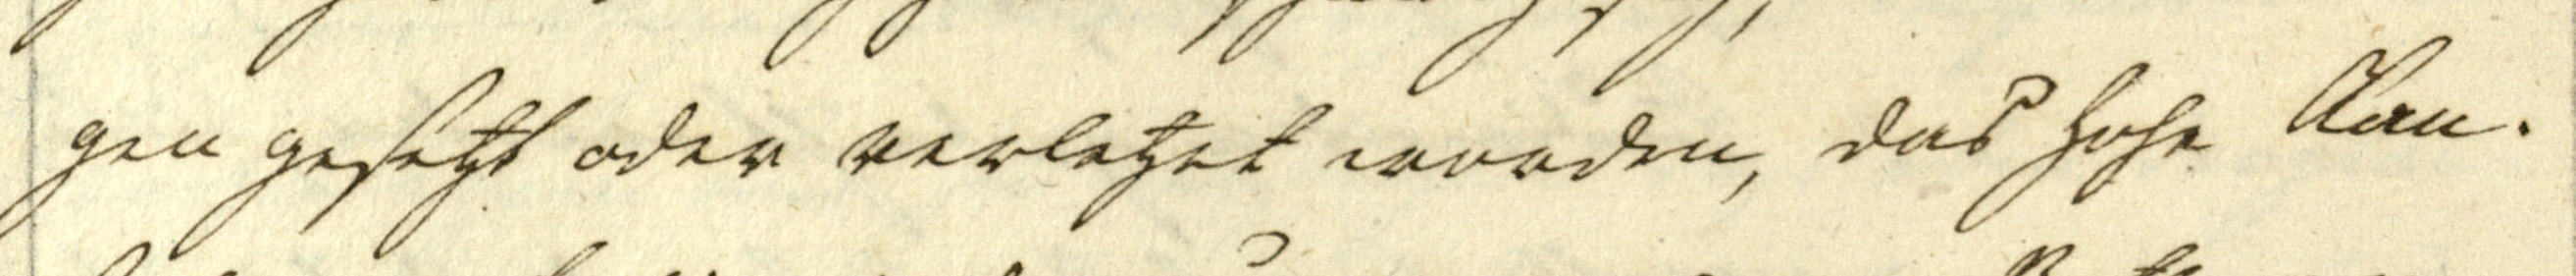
gen gesetzt oder verletzet worden, das hohe Kan¬
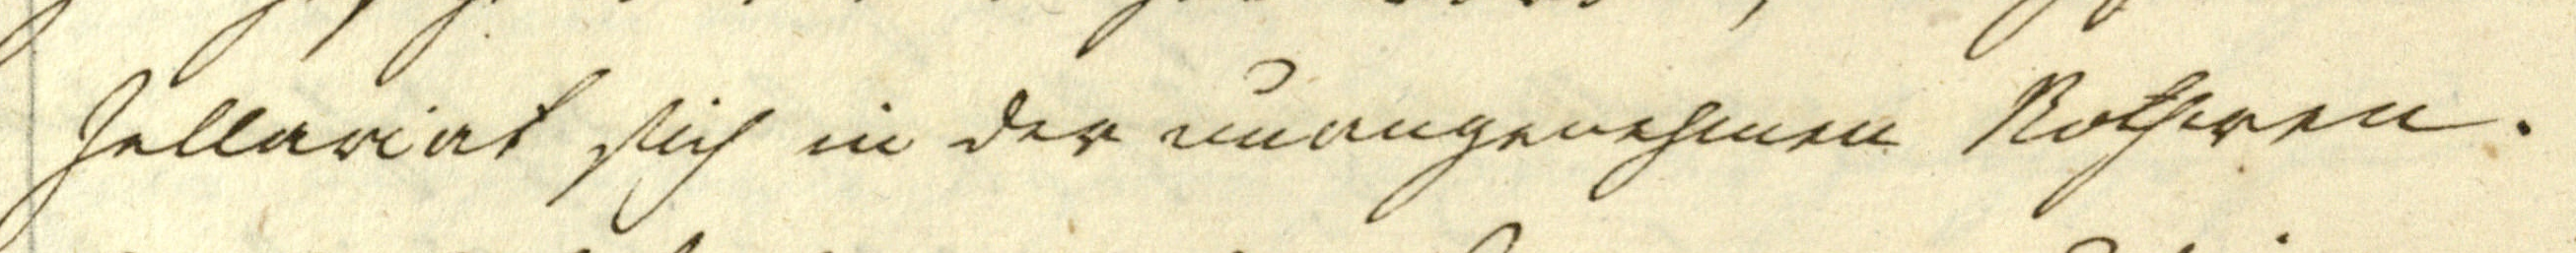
zellariat sich in der unangenehmen Nothwen-
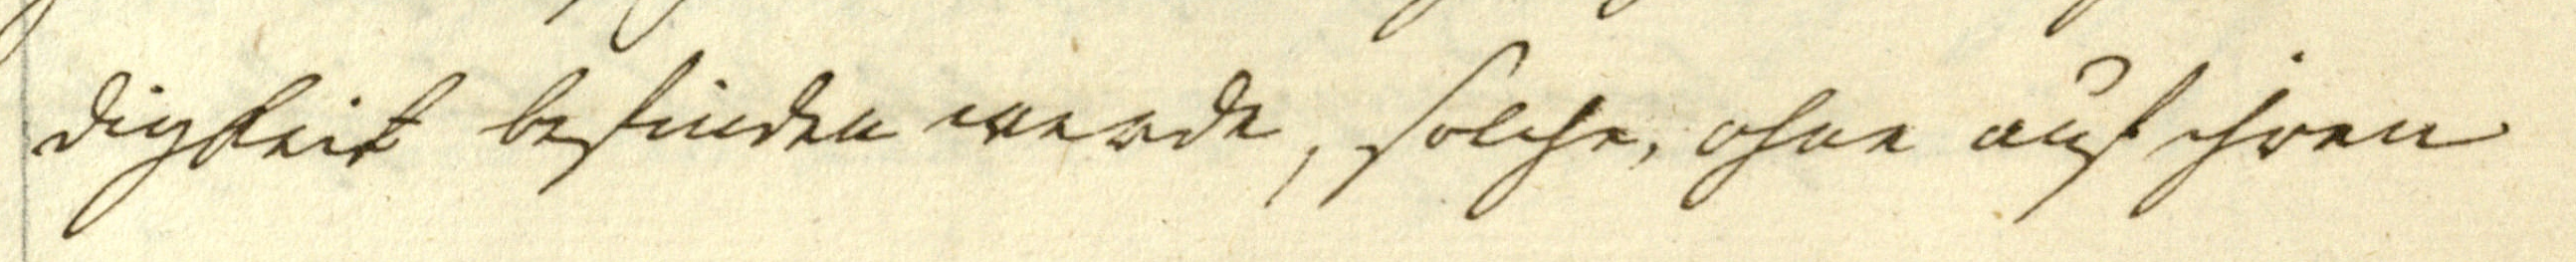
digkeit befinden werde, solche, ohne auf ihren
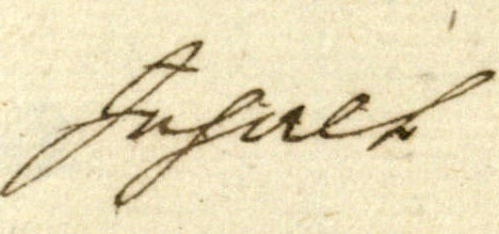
Inhalt
